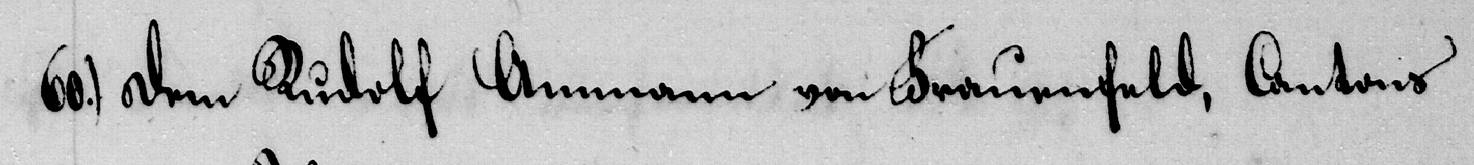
60.) Dem Rudolf Ammann von Frauenfeld, Cantons
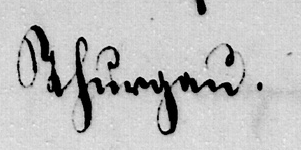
Thurgau.
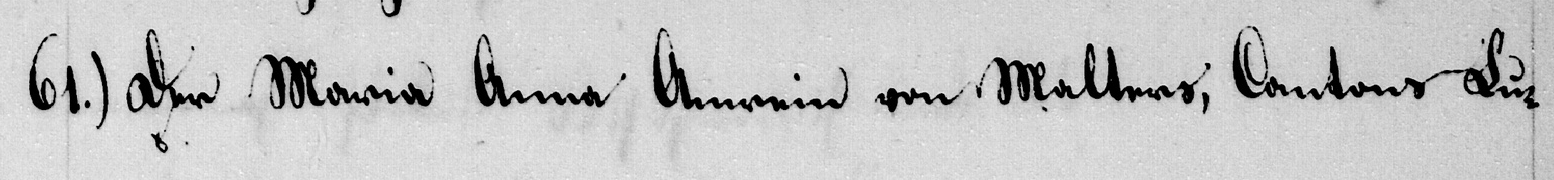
61.) Der Maria Anna Amrein von Malters, Cantons Lu¬
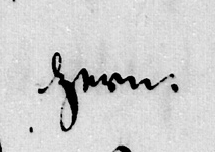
zern.
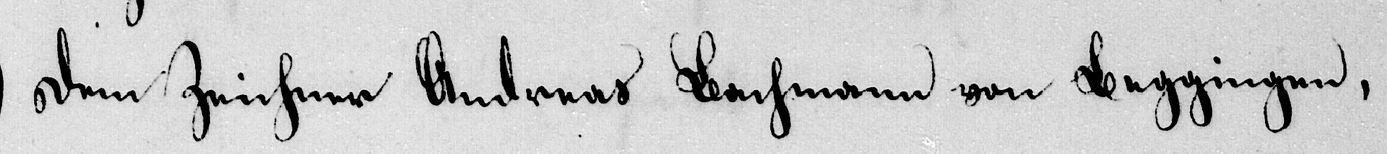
Dem Zeichner Andreas Bachmann von Beppingen,
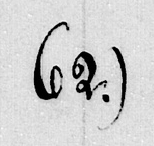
64.)
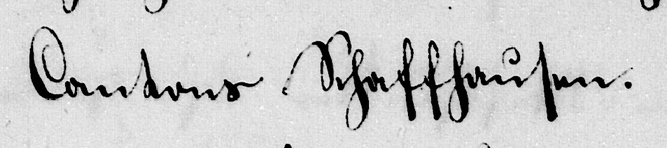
Cantons Schaffhausen.
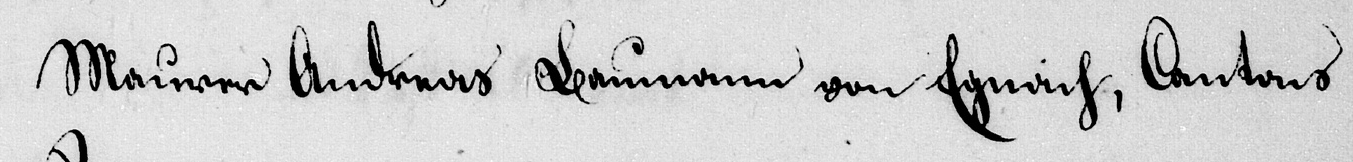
Maurer Andreas Baumann von Egnach, Cantons
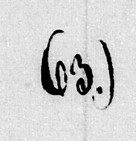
63.)
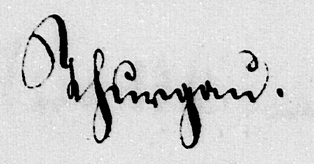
Thurgau.
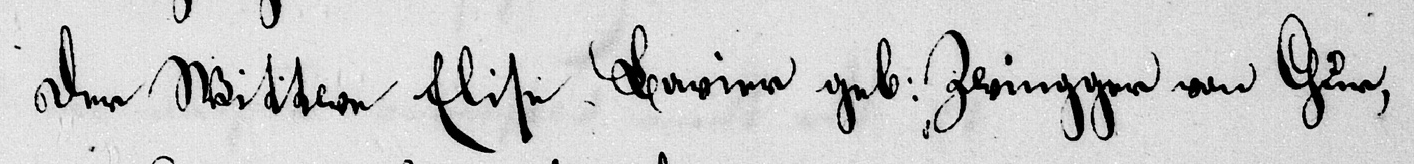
Der Wittwe Elise Bavier geb: Zwingger von Chur,
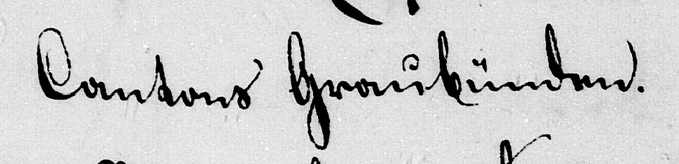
Cantons Graubünden.
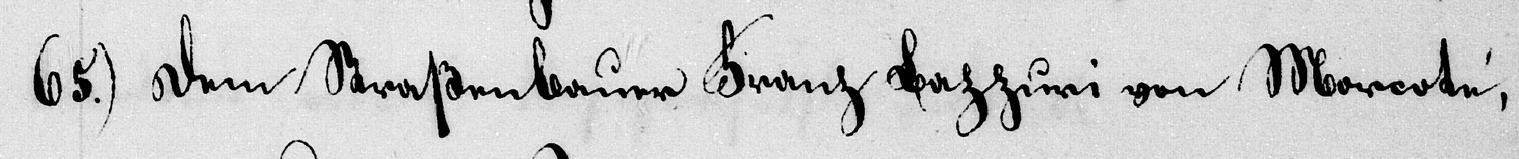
65.) Dem Straßenbauer Franz Bazzuri von Morcote,
